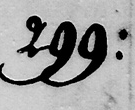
200.
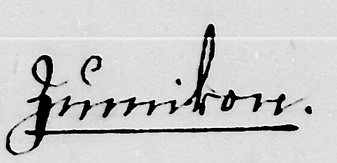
Zumikon.
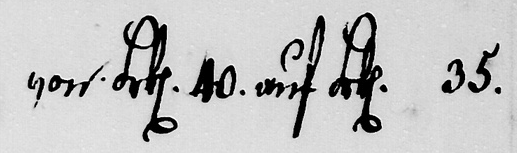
on Fr. 40. auf Fr. 35.
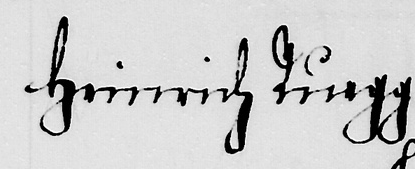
Heinrich Rueg¬
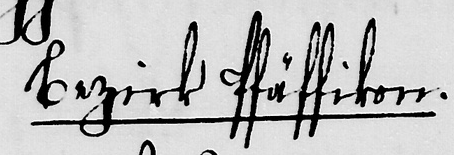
Bezirk Pfäffikon.
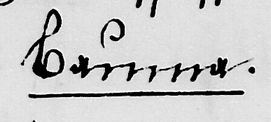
Bauma.
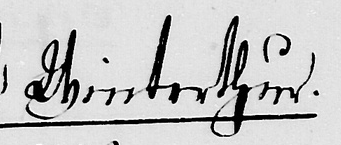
Winterthur.
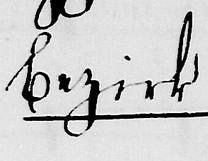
Bezirk
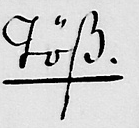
Töß.
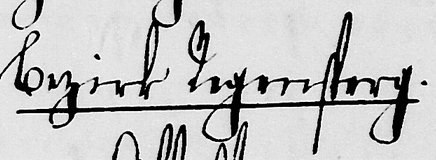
Bezirk Regensberg.
